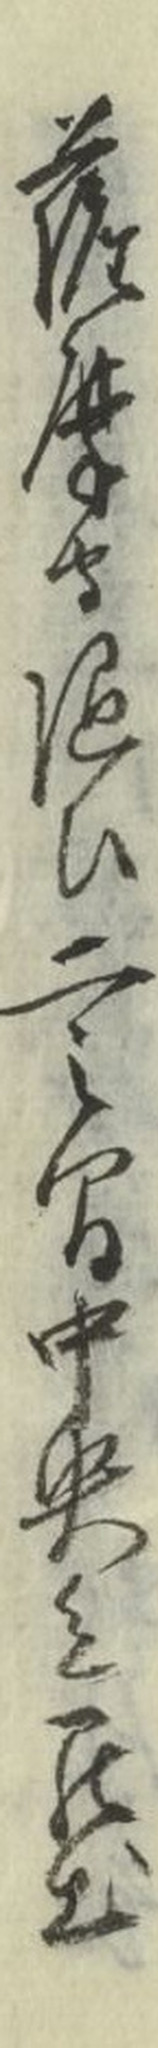薩摩守随ひ二之間中央迄罷出
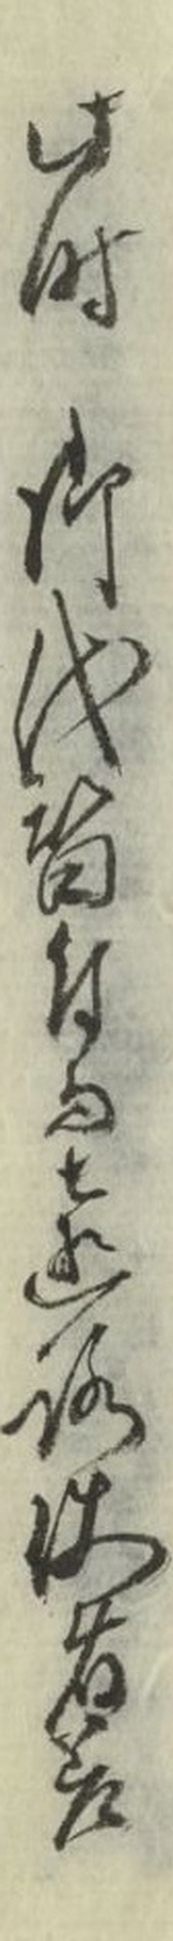此時御代替付而遠路使者差
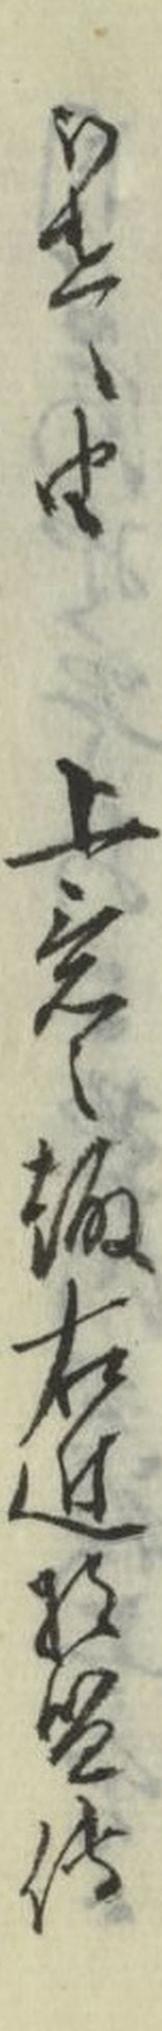被遣候由上意之趣右近将監伝
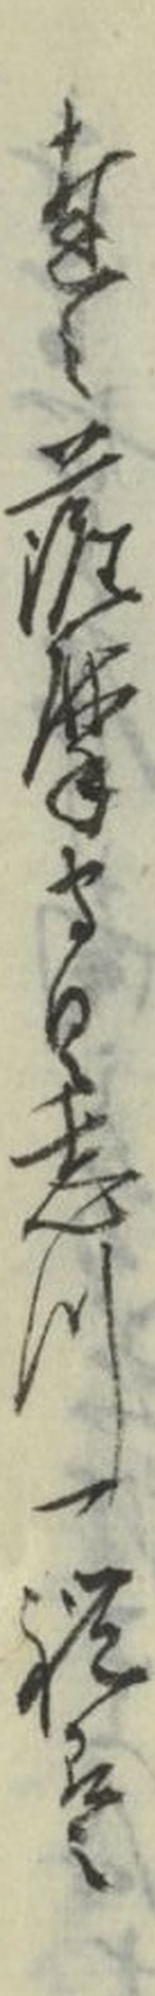達之薩摩守具志川一礼有之
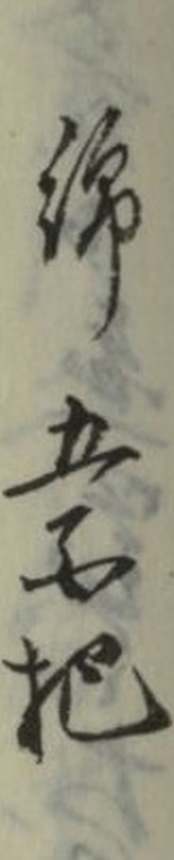綿五百把
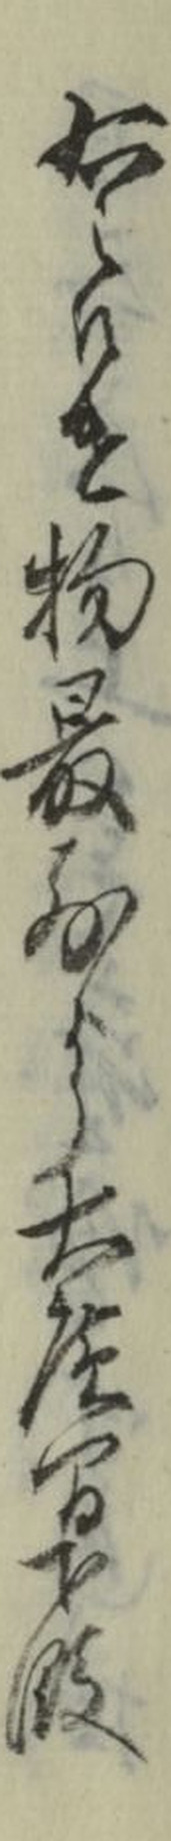右之御遣物最前より大広間下段
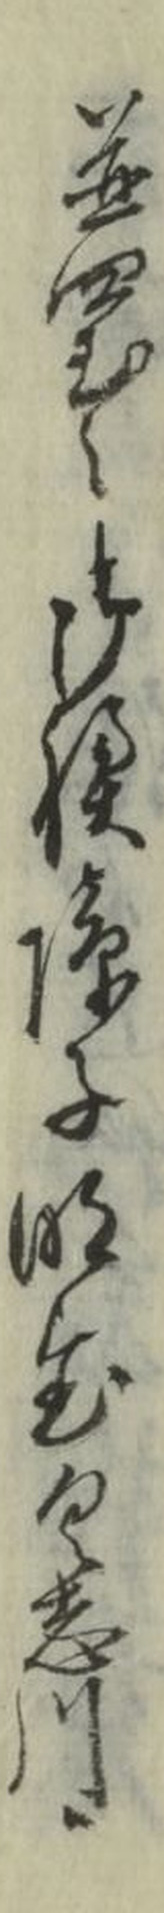並置之御襖障子明置具志川え
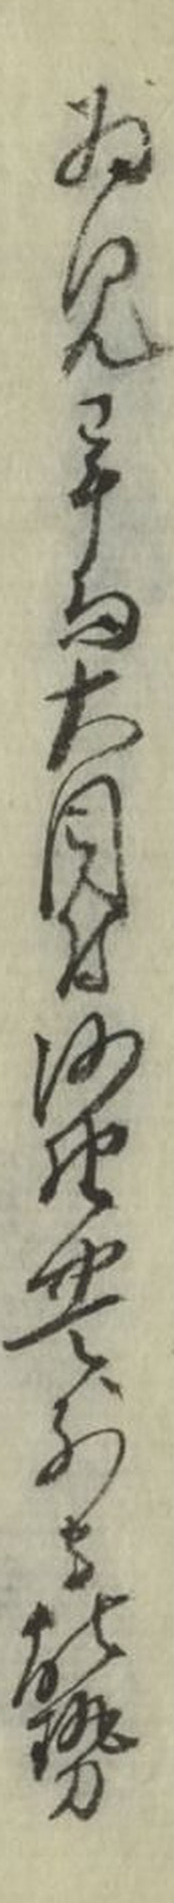為見畢而大目付河野豊前守能勢
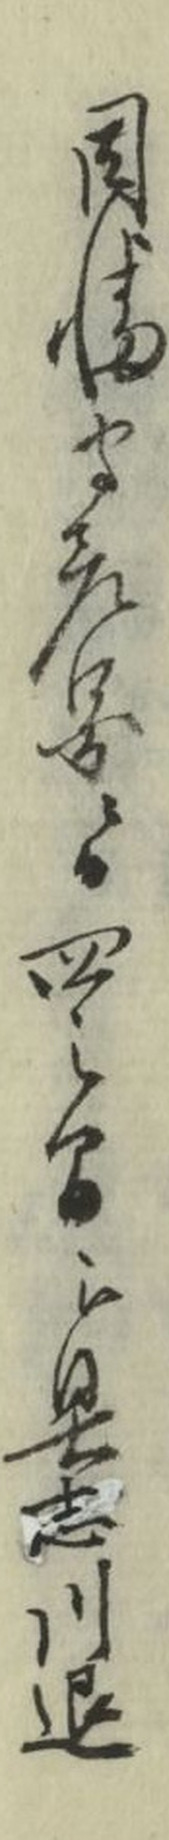因幡守差図に而四之間え具志川退
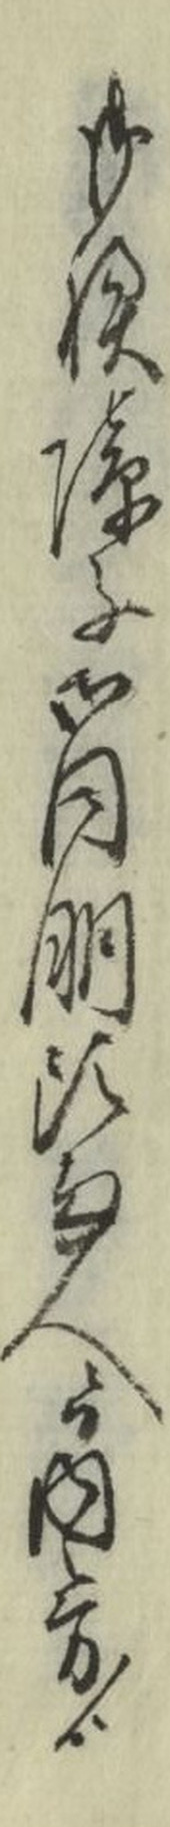御襖障子御同朋頭両人に而内之方ゟ

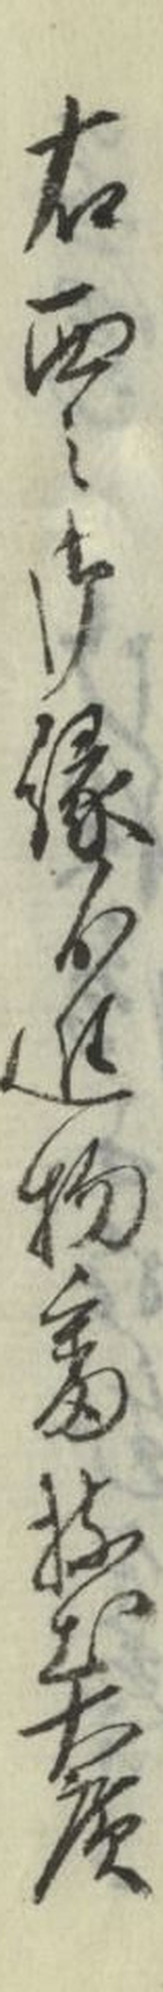右西之御縁ゟ進物番持出大広
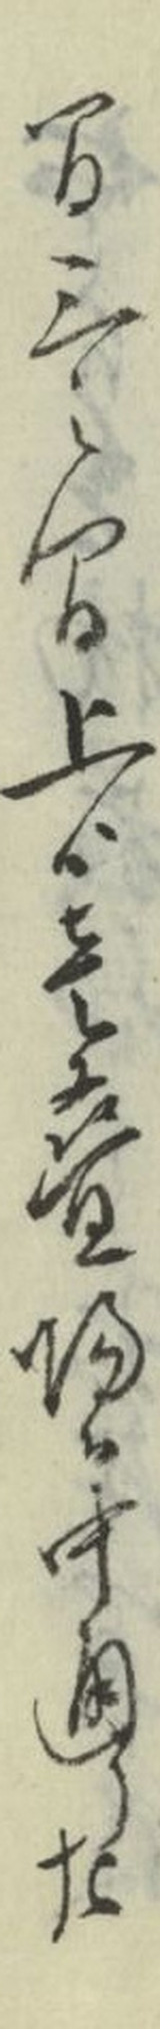間三之間上ゟ壱畳隔而中通り左
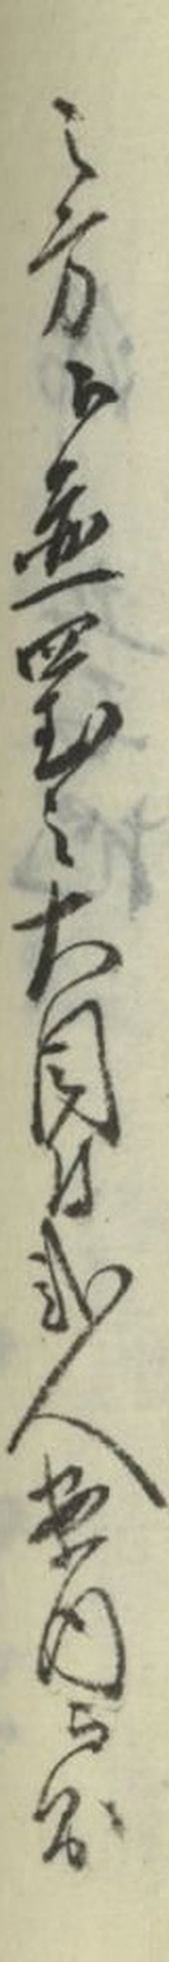之方え並置之大目付弐人案内而則
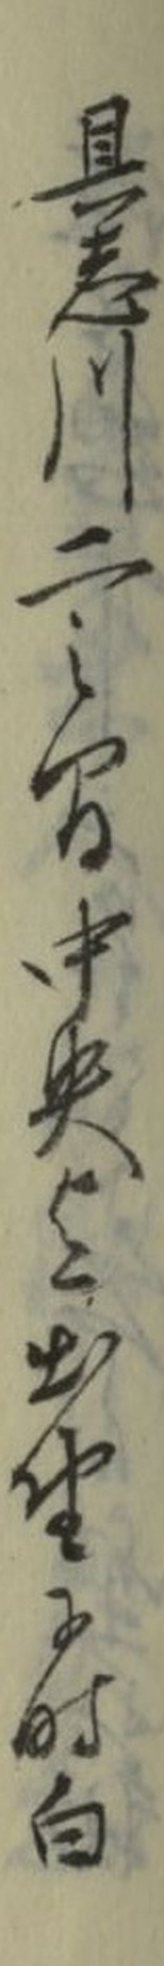具志川二之間中央迄出坐于時白
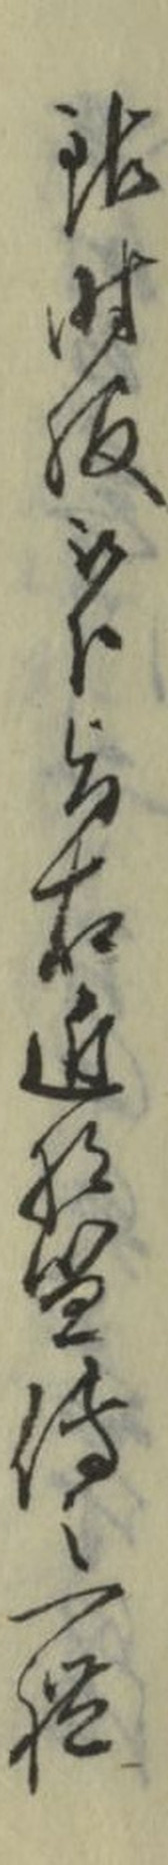銀時服被下旨右近将監伝之一礼
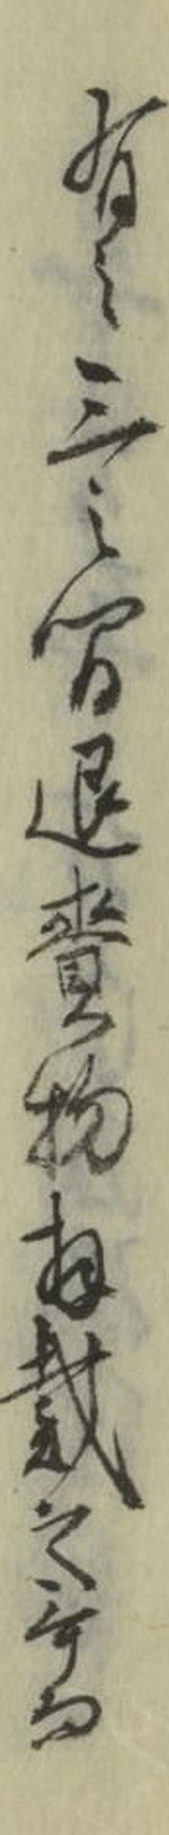有之三之間退賚物拝戴之畢而
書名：琉球人来朝記 四之五
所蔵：University of the Ryukyus Library
